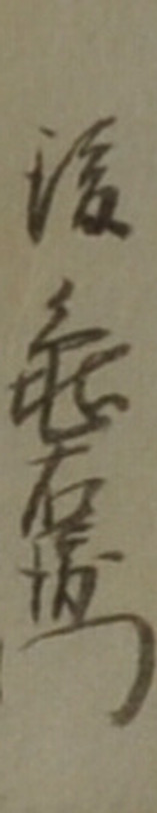後亀右衛門
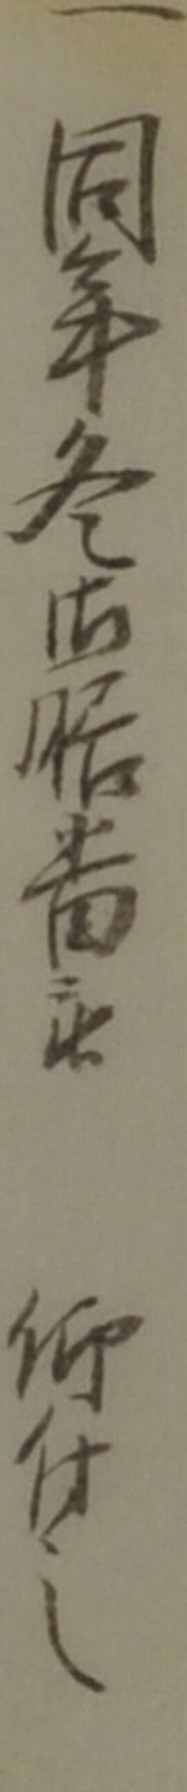一同年冬御膳番被仰付之
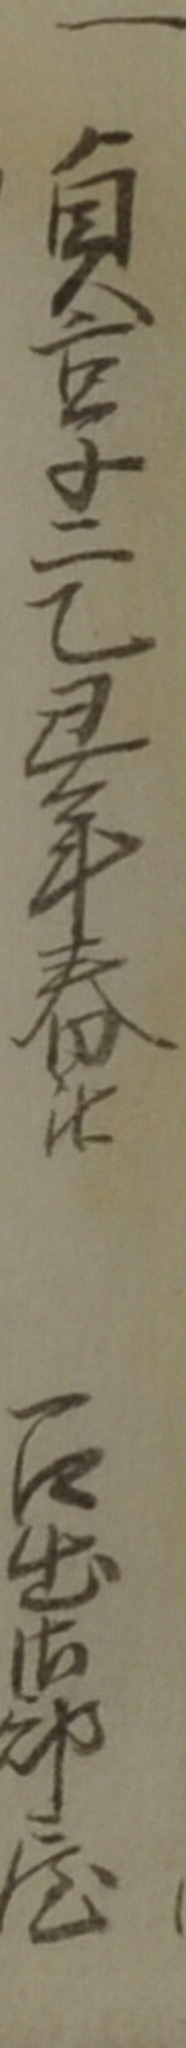一貞享二乙丑年春被召出御部屋
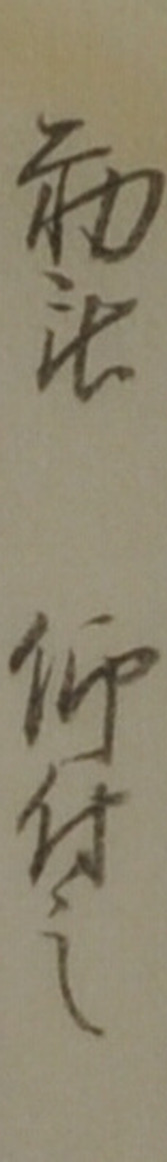勤被仰付之
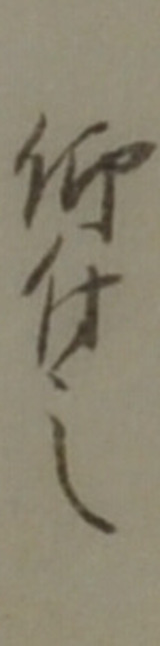仰付之
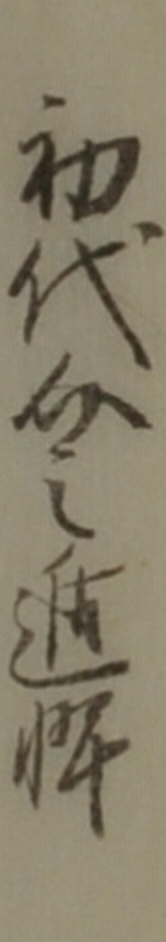初代介之進忰
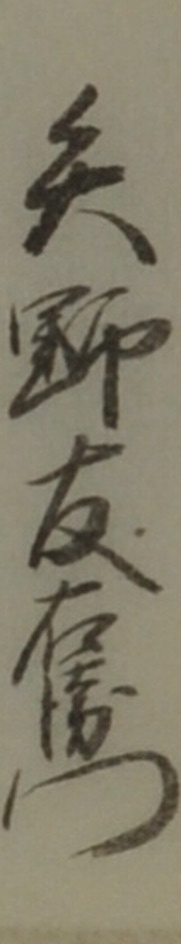矢野友右衛門
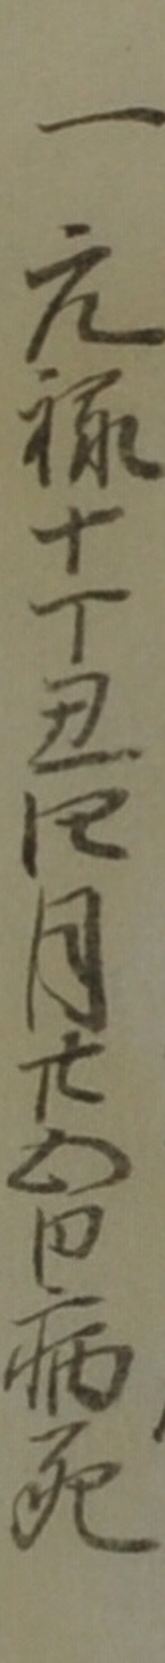一元禄十丁丑四月廿五日病死
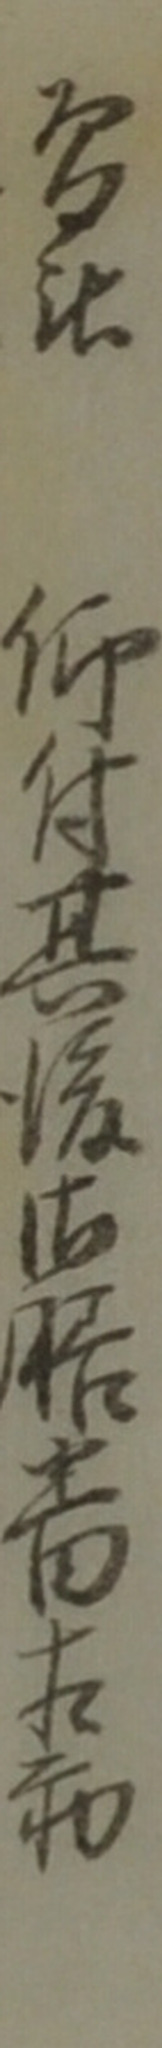習被仰付其後御膳番相勤
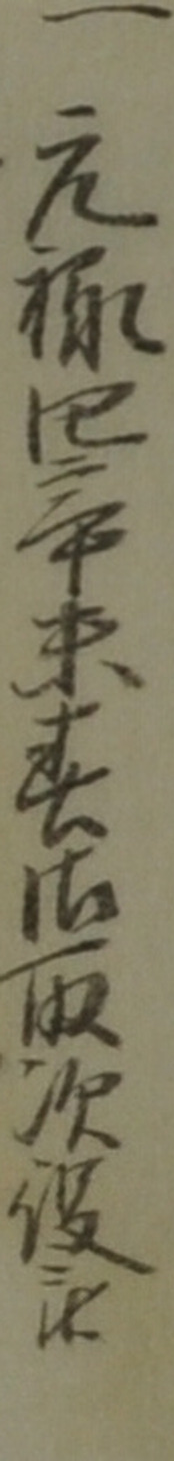一元禄四辛未春御取次役被
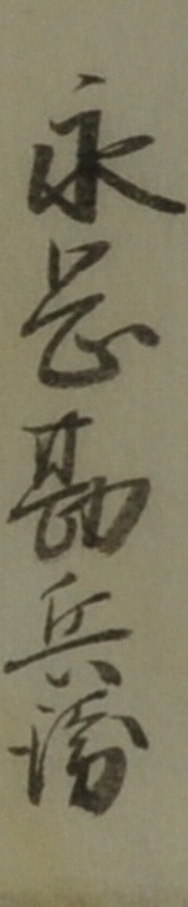永岡勘兵衛
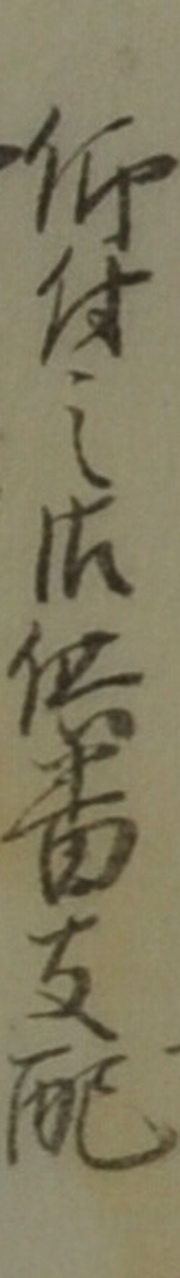仰付之御供番支配
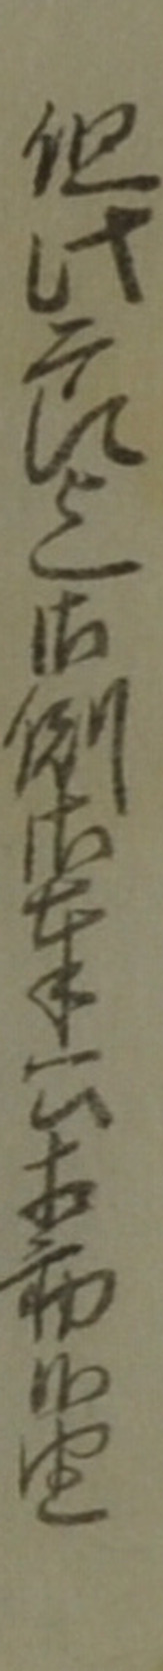但此節迄御側御奉公相勤候由
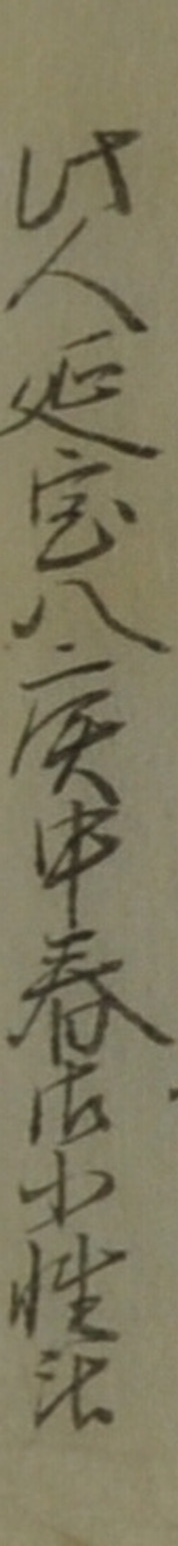此人延宝八庚申春御小性被
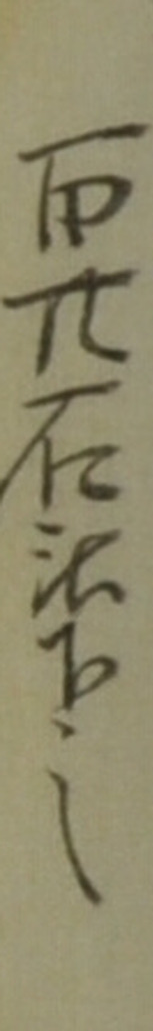百廿石被下之
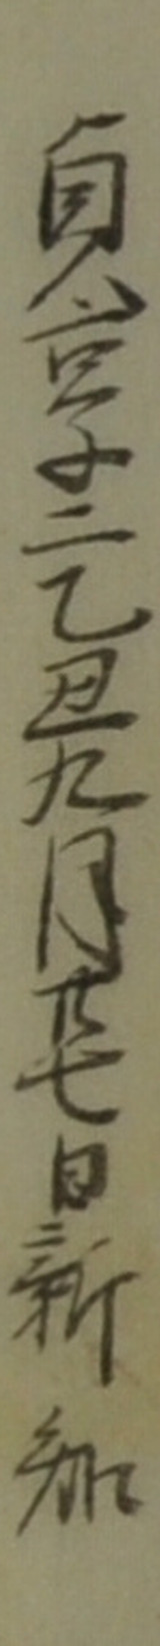貞享二乙丑九月廿七日新知
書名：諸御役代々録（五）
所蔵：伊那市立高遠町図書館・合同会社AMANE
